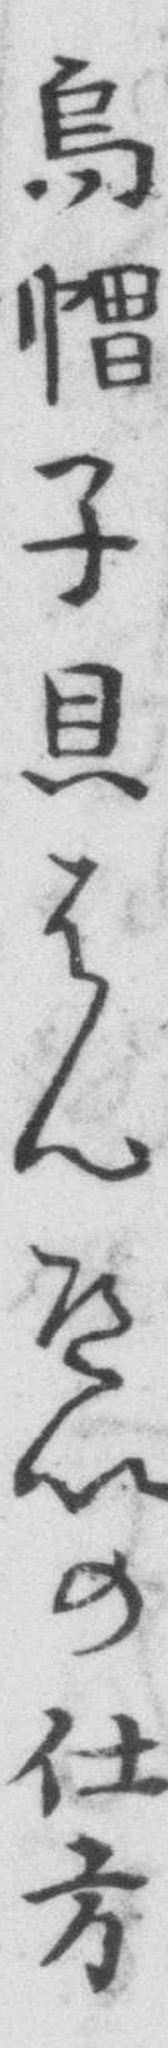烏帽子貝はんへいの仕方
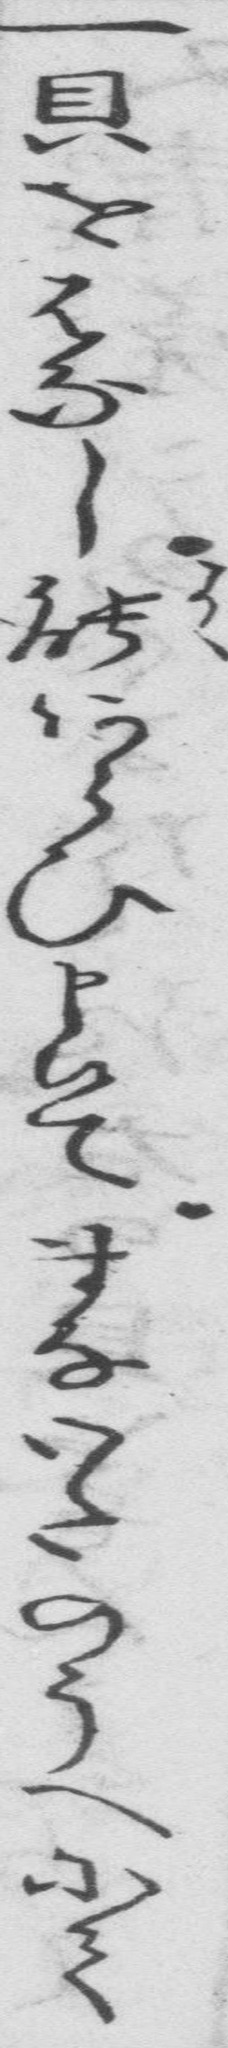一貝をはなし。能あらひ申候て。まないたのうへにて
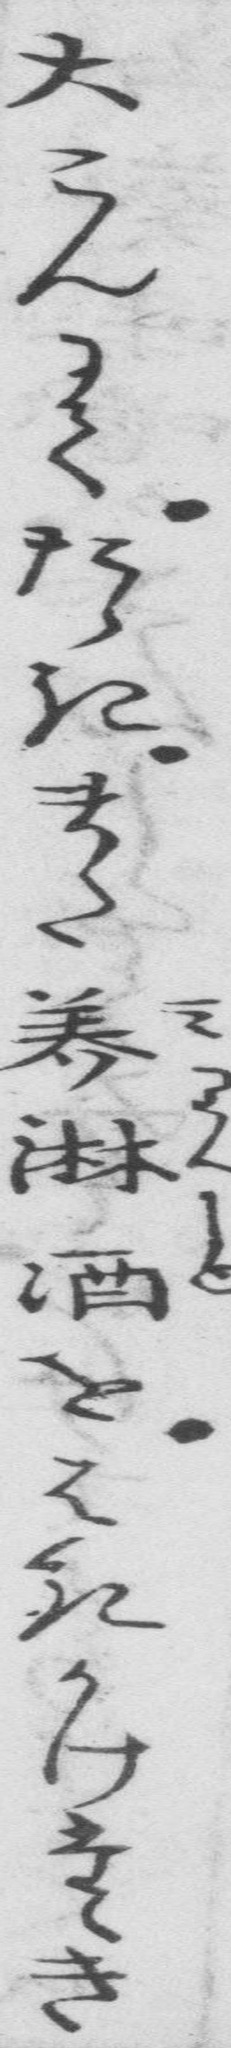大こんにて。たゝき。また美淋酒を。はきかけたゝき
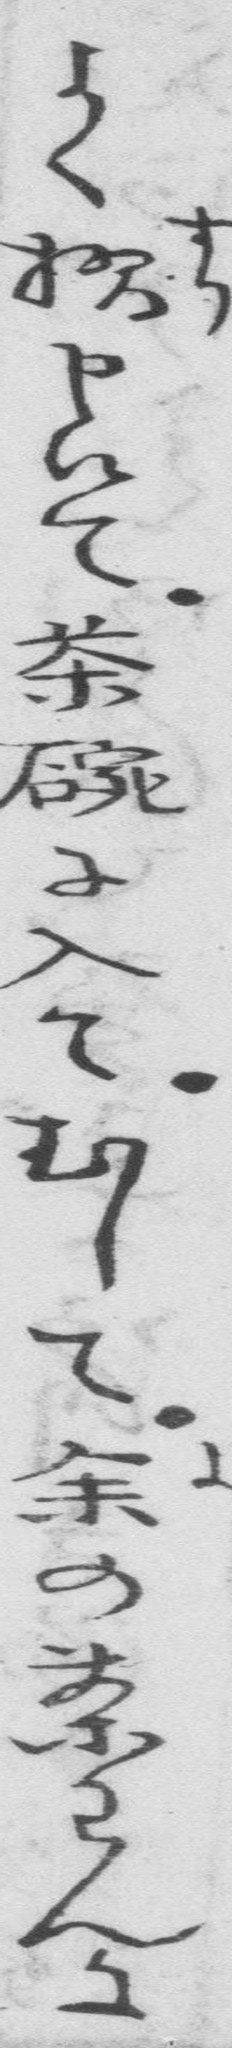よく摺申候て。茶碗に入て。むして。余の茶わんに
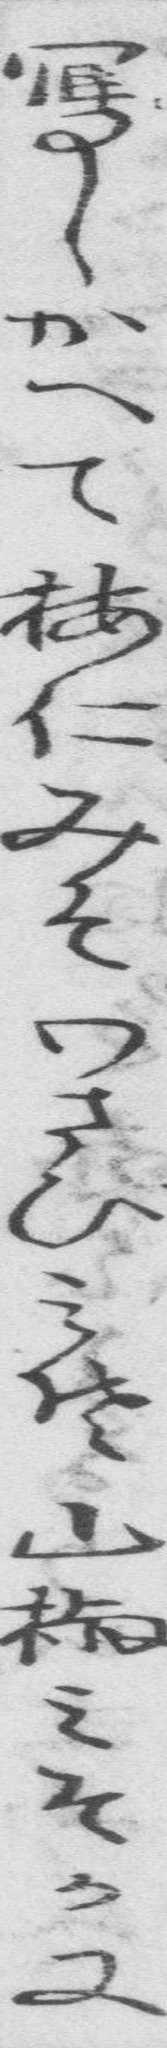写しかへて。梅仁みそ。わさびみそ。山椒みそか。又
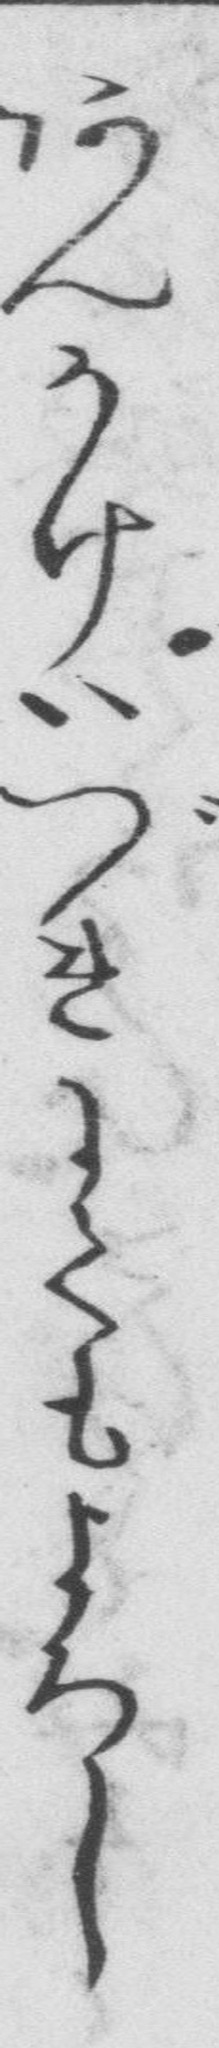あんかけ。いづれにてもよろし
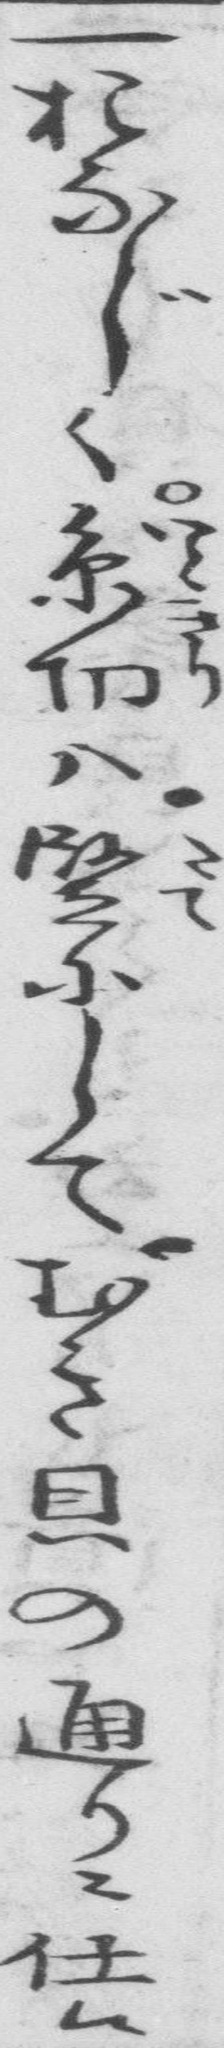一おなじく。糸切は。竪にして。むき貝の通りに仕候
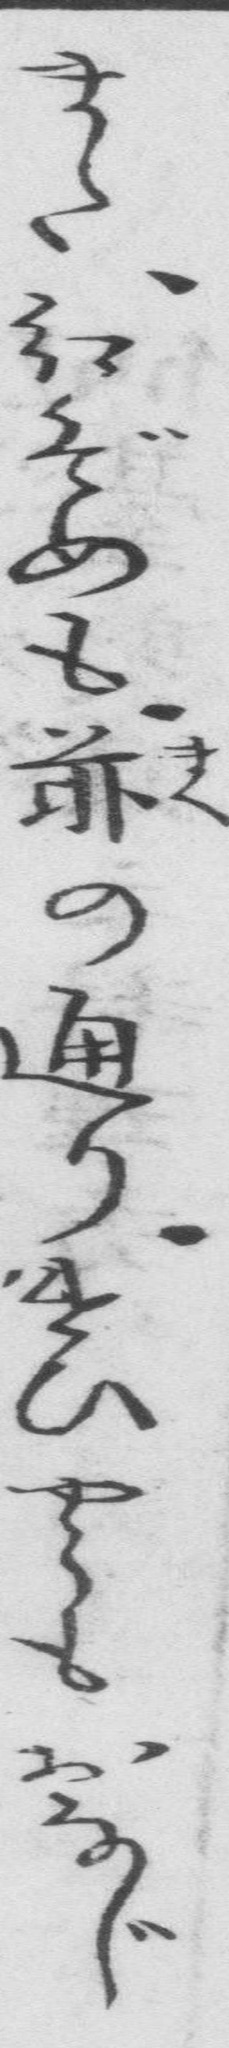また。紅ぞめも。前の通り。遣ひやうもおなじ
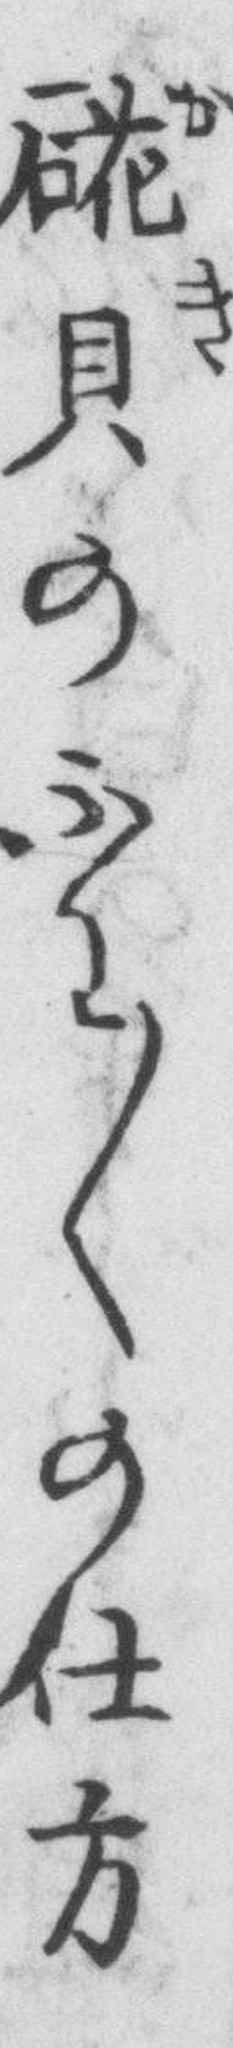硴貝のふわ〳〵の仕方
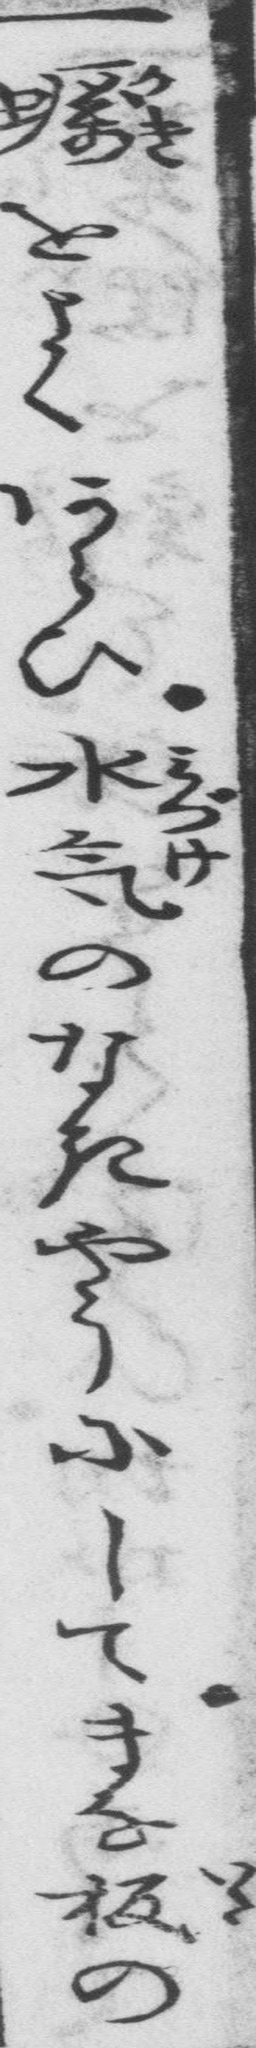一蠣をよくあらひ。水気のなきやうにして。まな板の
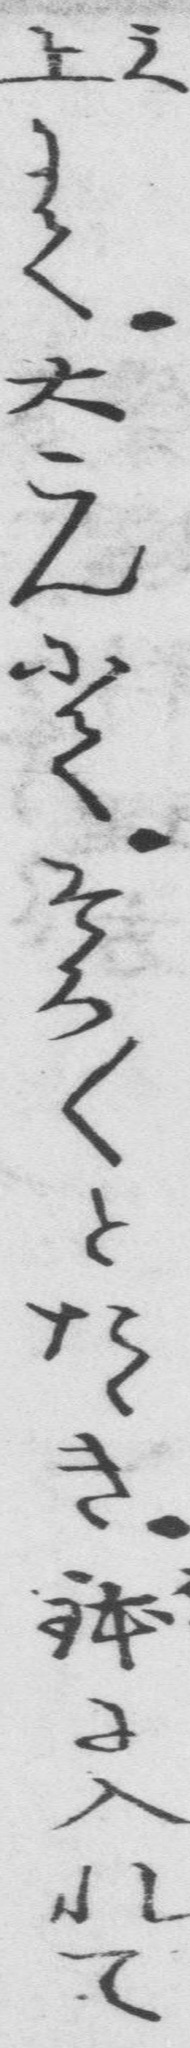上にて。大こんにて。そろ〳〵とたゝき。鉢に入れて
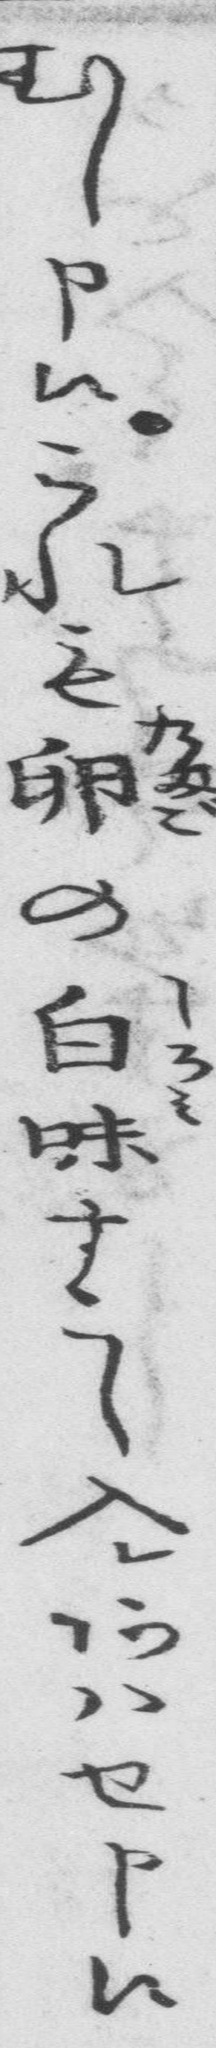むし申候。これも卵の白味すこし入れあはせ申候
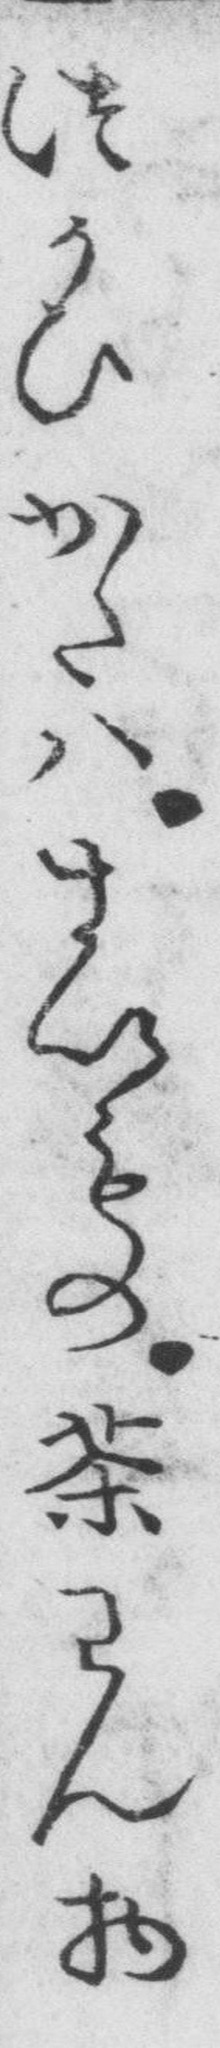つかひかたは。すいもの。茶わん物
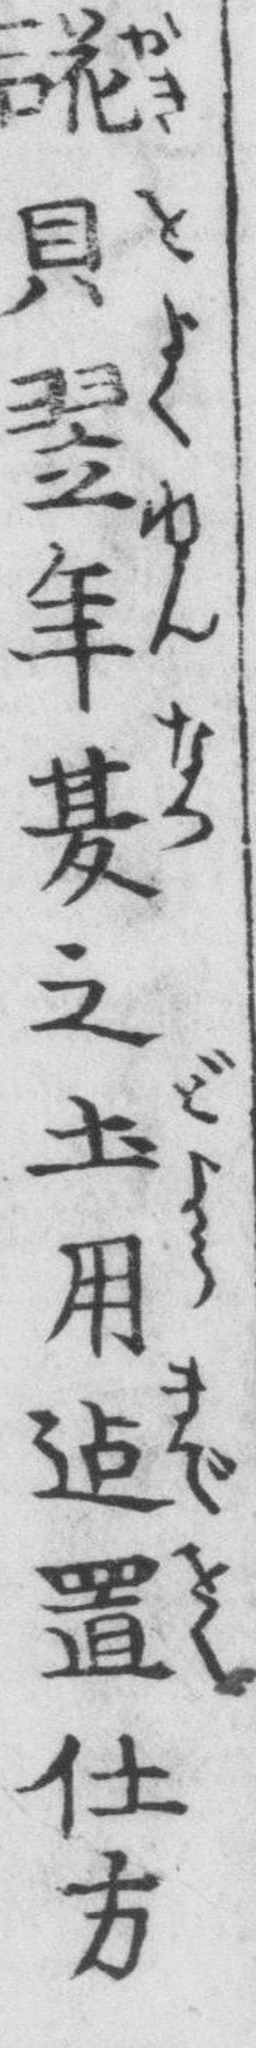硴貝翌年夏之土用迄置仕方
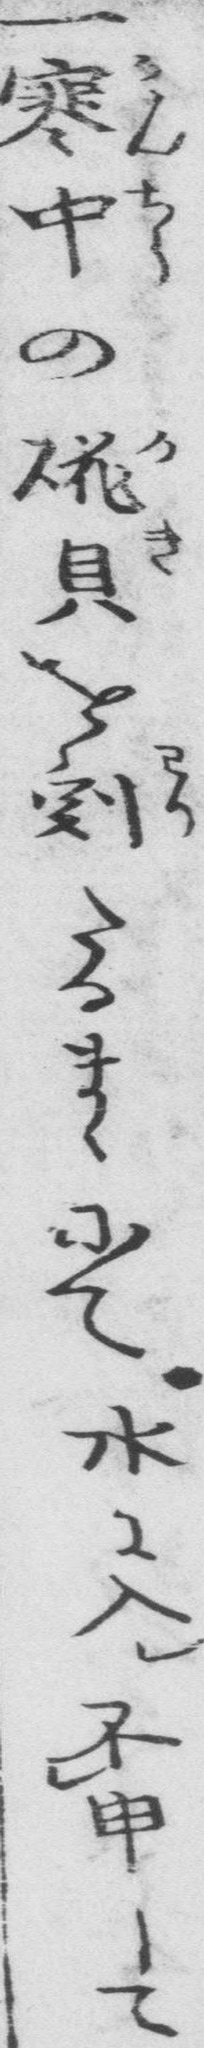一寒中の硴貝を割たるまゝにて。水に入れ不申して
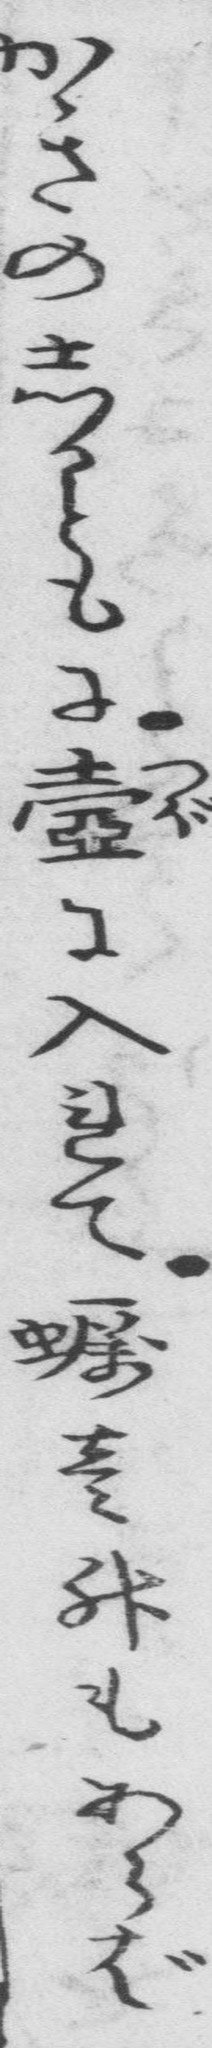かきのしるともに。壺に入れて。蠣壱升もあらば
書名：萬寳料理秘密箱
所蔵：大阪府立大学学術情報センター 国文学研究資料館
